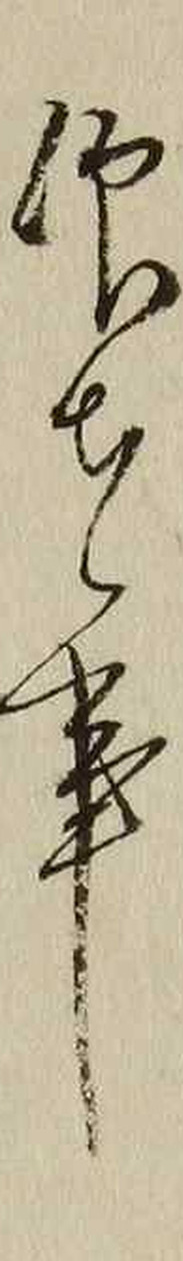仰出候事
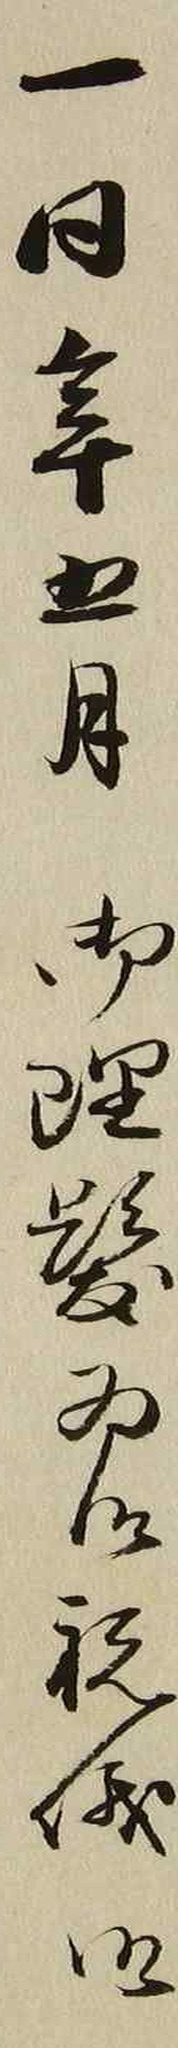一同年五月御理髪為御祝儀御
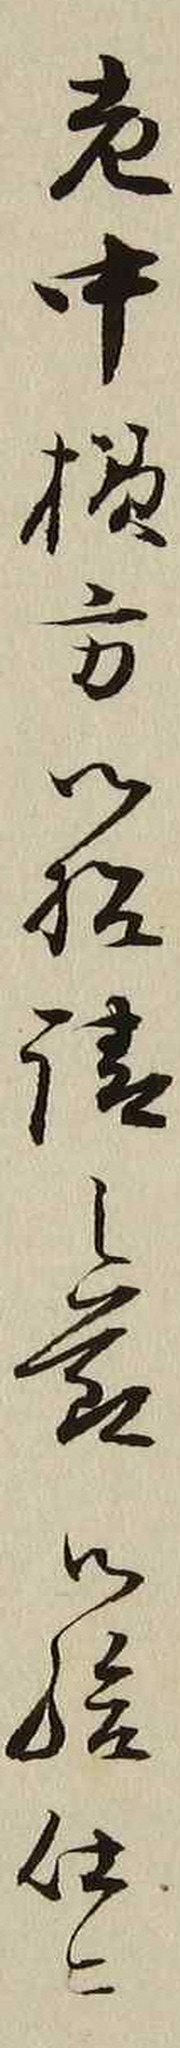老中様方御招請之節御給仕被
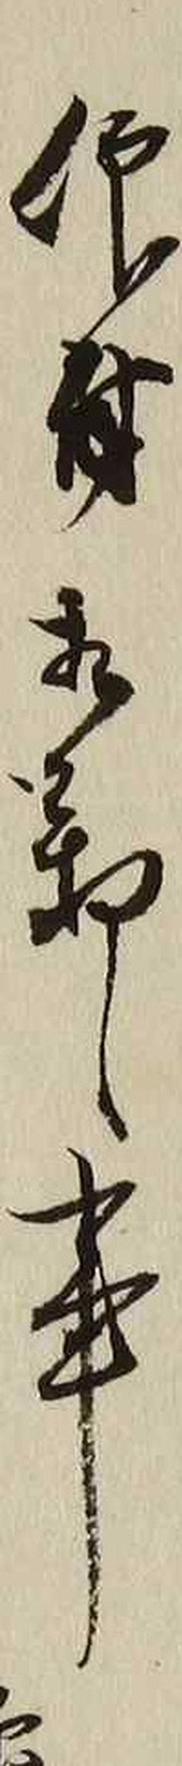仰付相勤候事
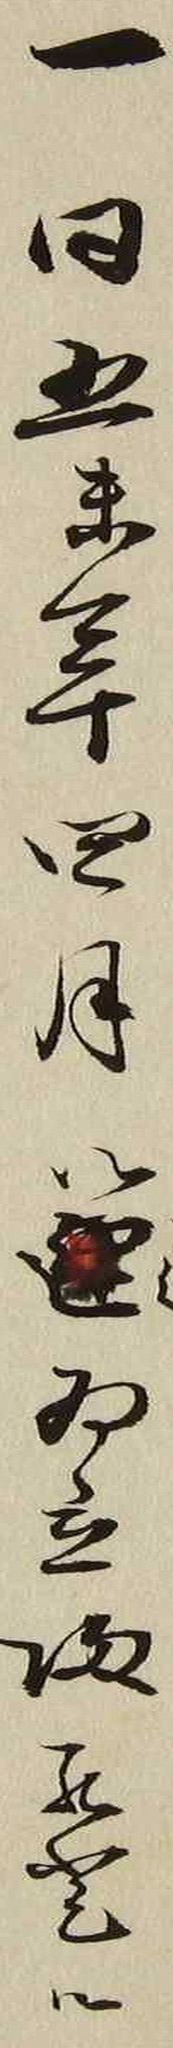一同五未年四月御迎為立帰罷登候
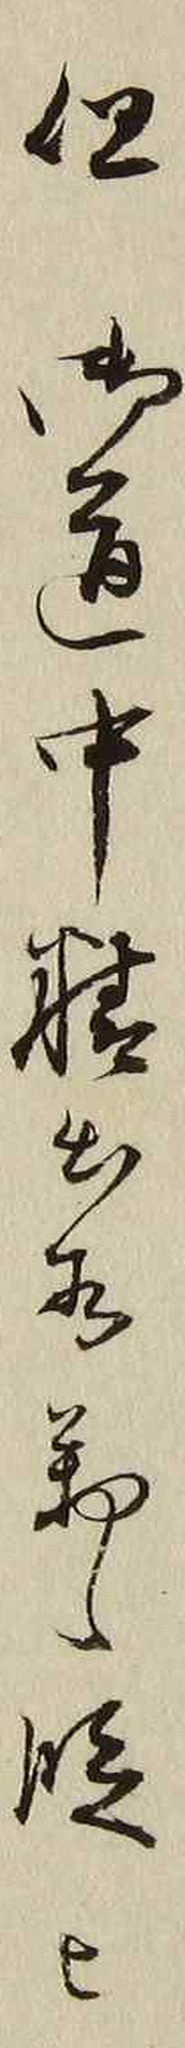但御道中精出相勤候段被
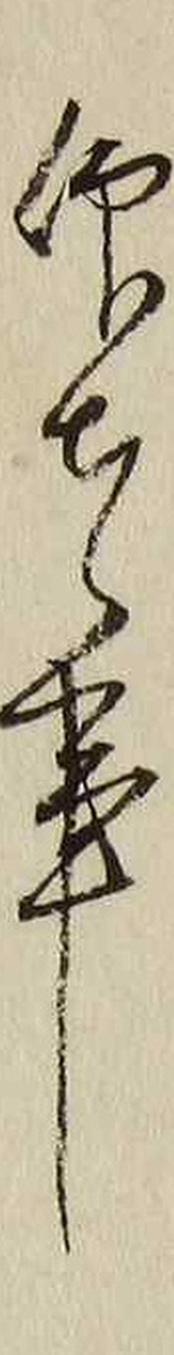仰出候事
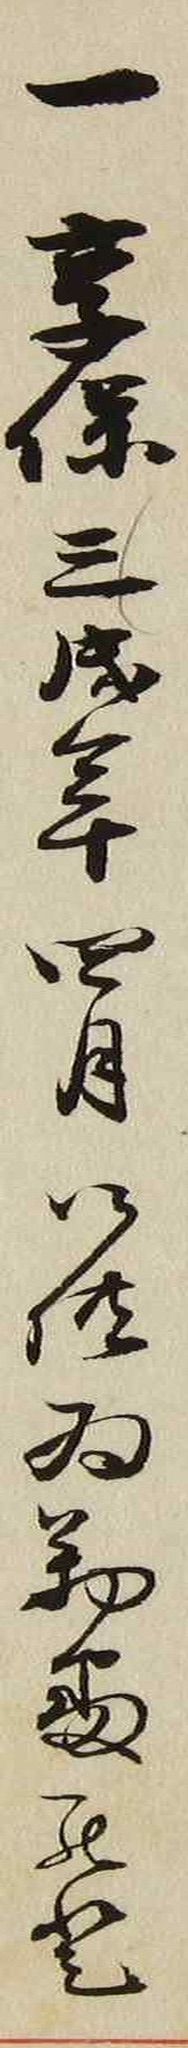一享保三戌年四月御供為勤番罷登
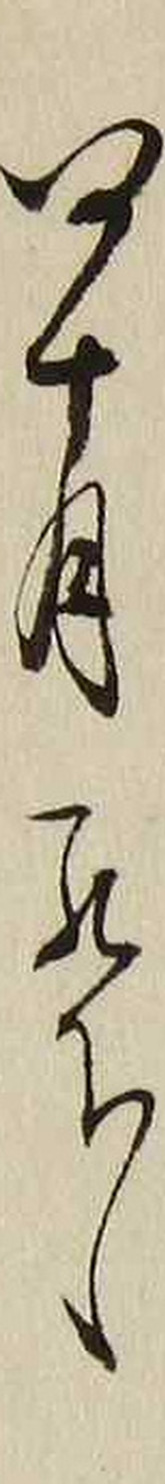同十月罷下候
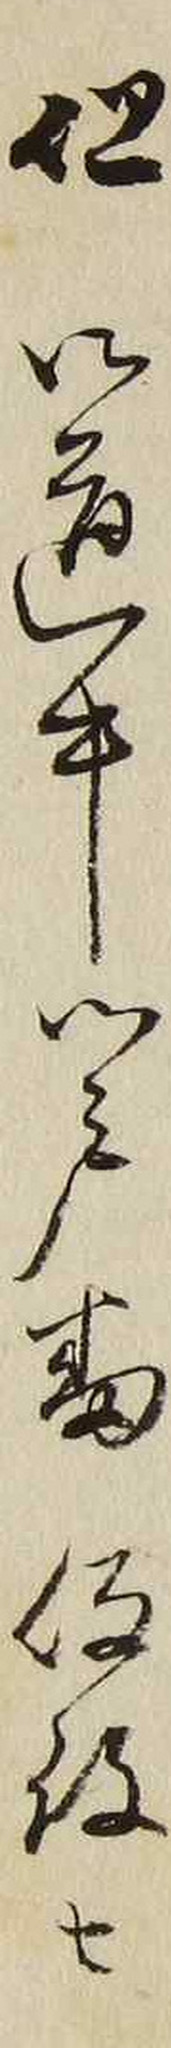但御道中御戸番仮役被
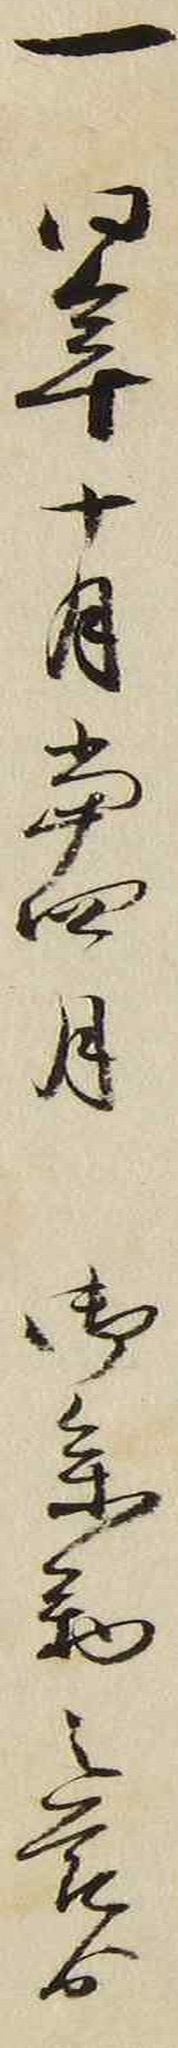一同年十月当四月御参勤之節ゟ

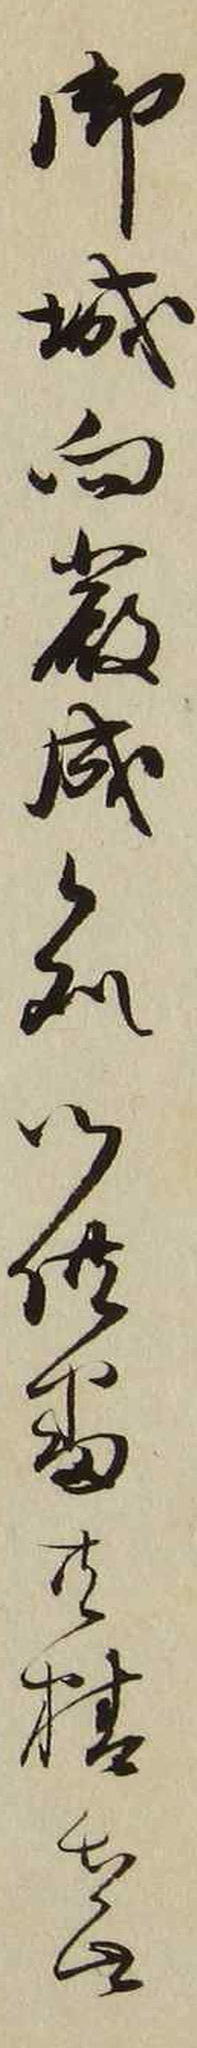御城向厳成候処御供番共精出無
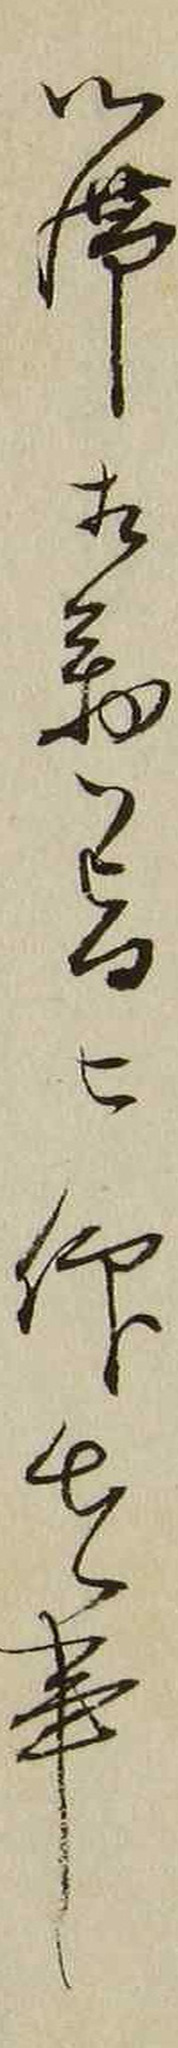御滞相勤候旨被仰付候事
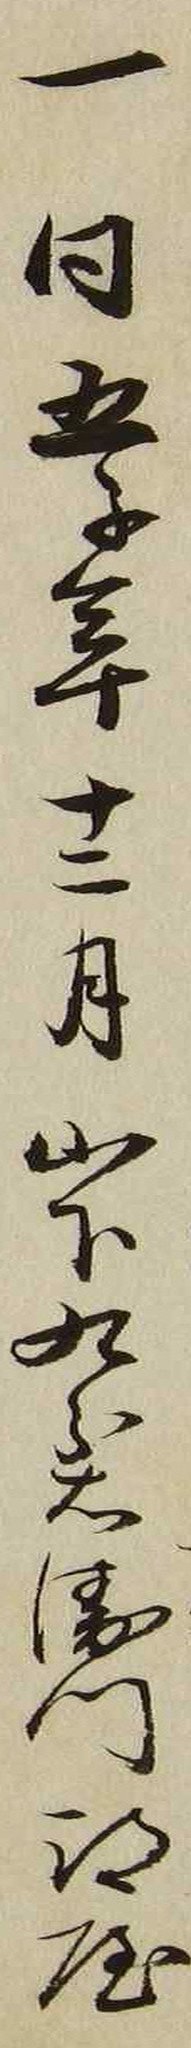一同五子年十二月山下九郎右衛門跡屋
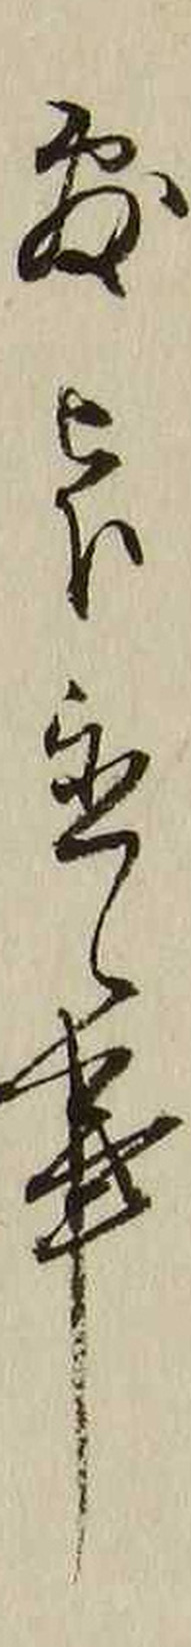敷被下置候事
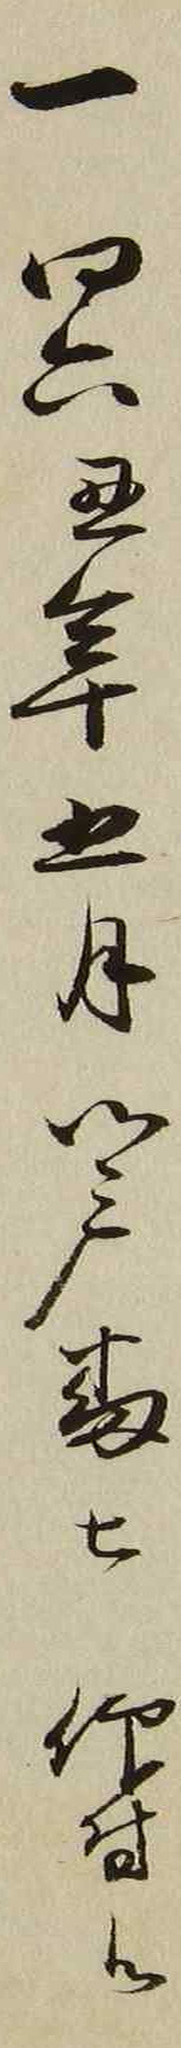一同六丑年五月御戸番被仰付候
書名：諸士系譜　巻之292　き之部1
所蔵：会津若松市立会津図書館
